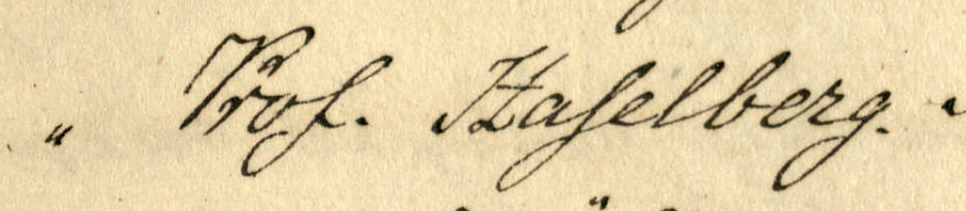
Prof. Haselberg.
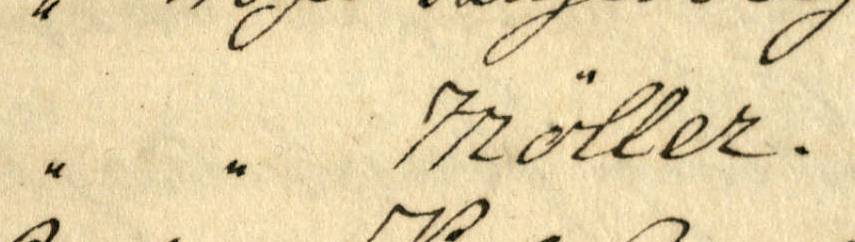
Möller.
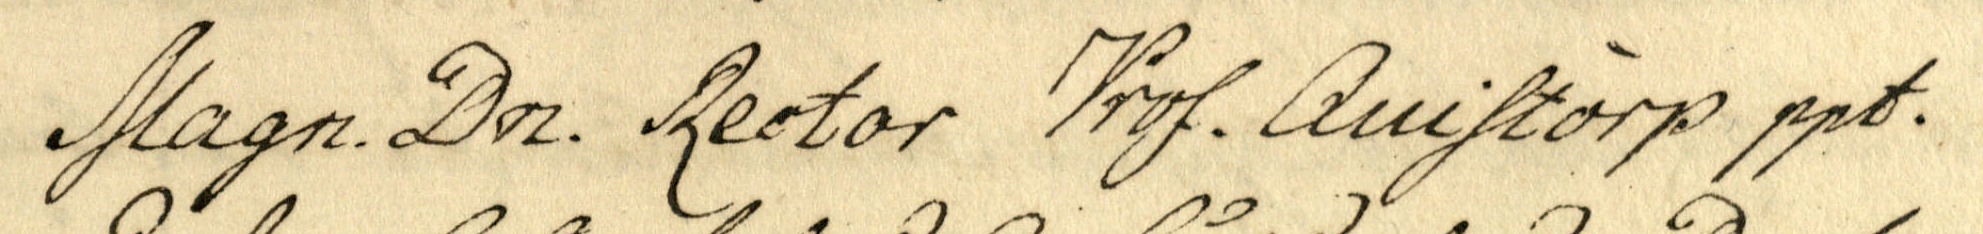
Magn. Dn. Rector Prof. Quistorp ppt.
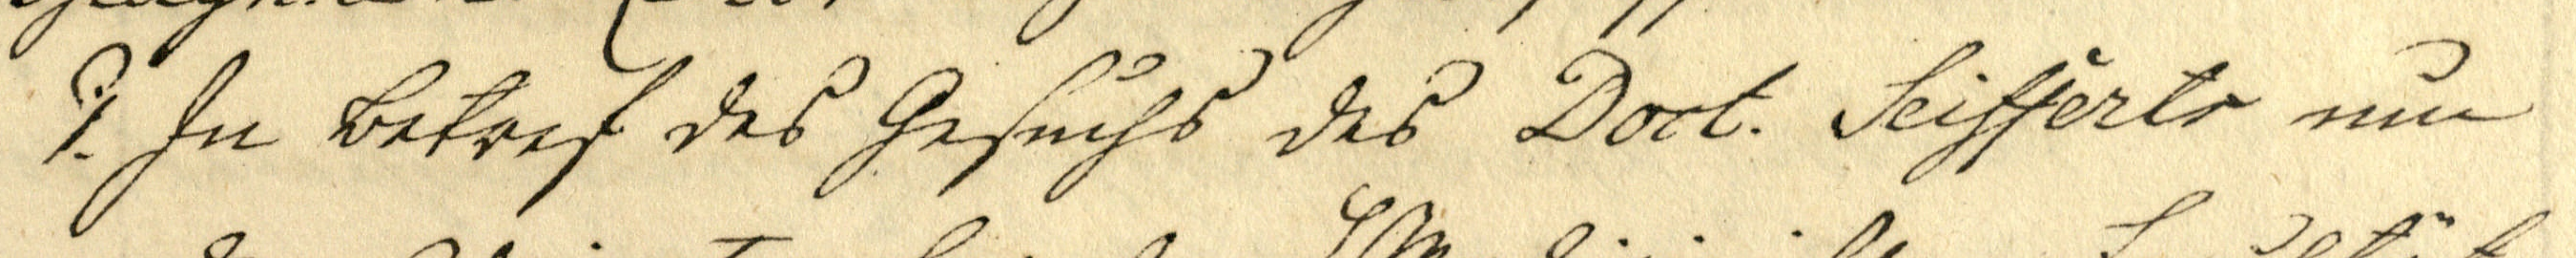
1. In Betref des Gesuchs des Doct. Seifferts um
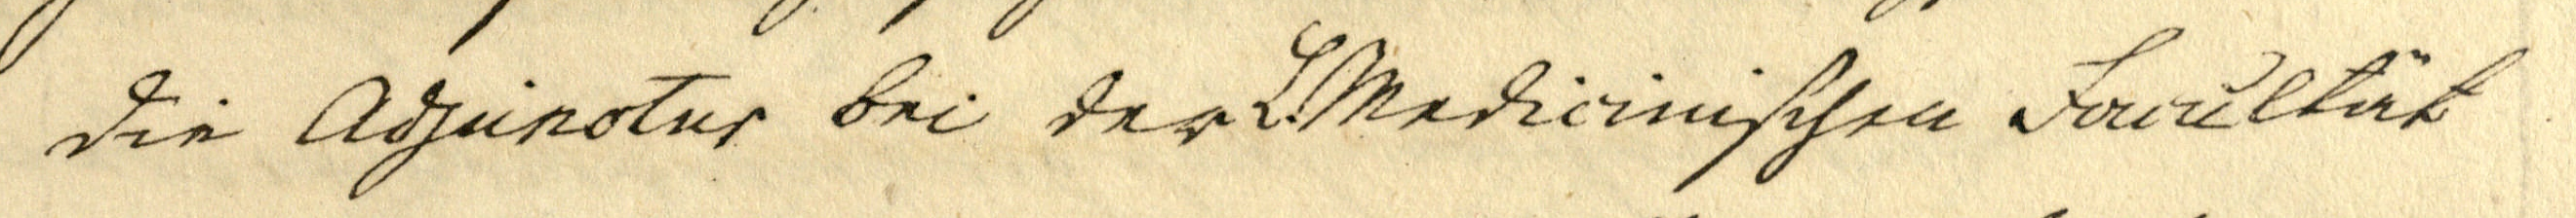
die Adjunctur bei der L. Medicinischen Facultät
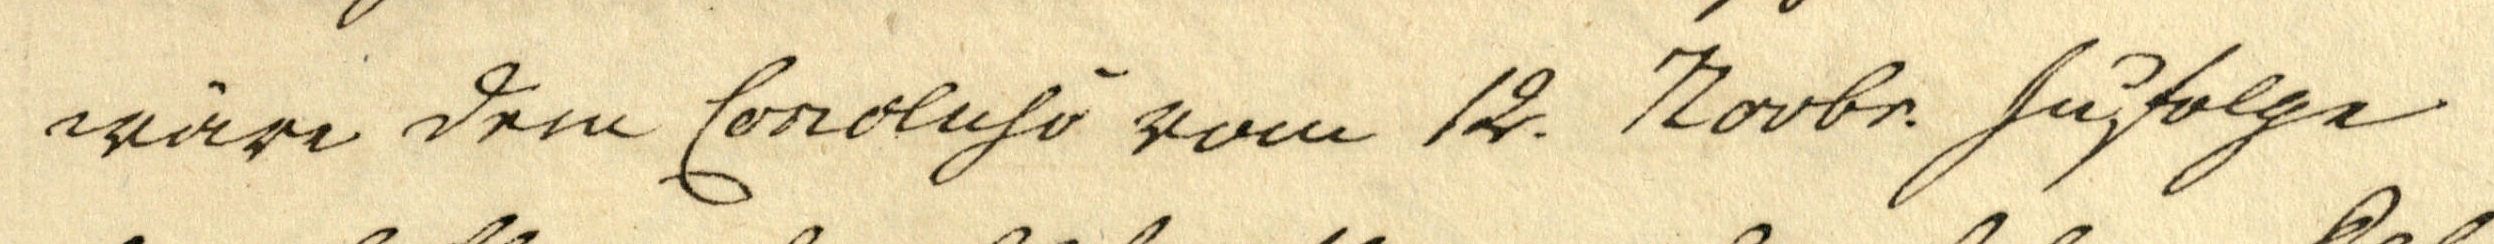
wäre dem Concluso vom 12. Novbr. zufolge
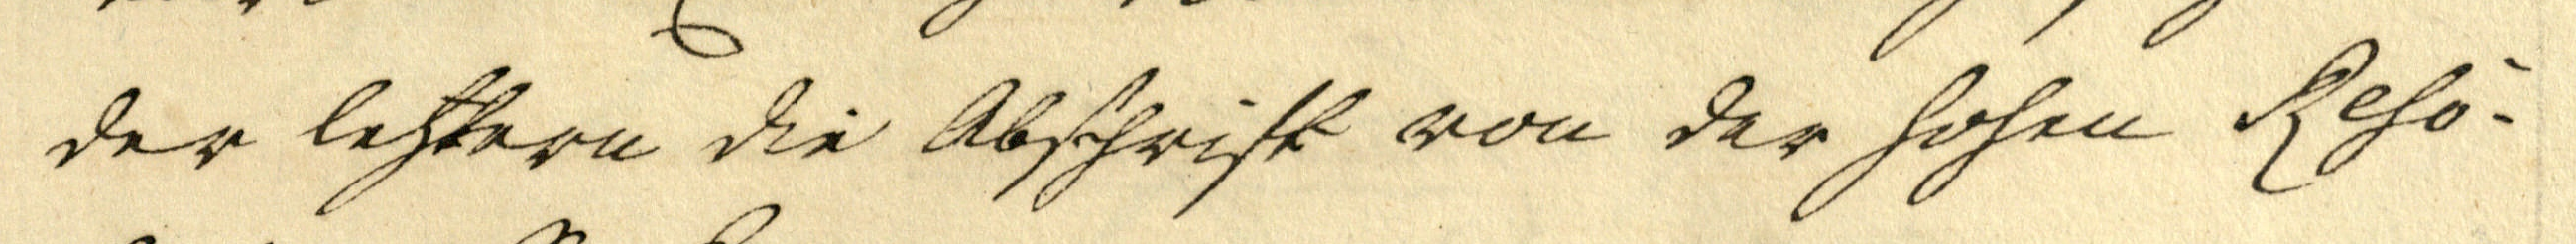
der letztern die Abschrift von der hohen Reso¬
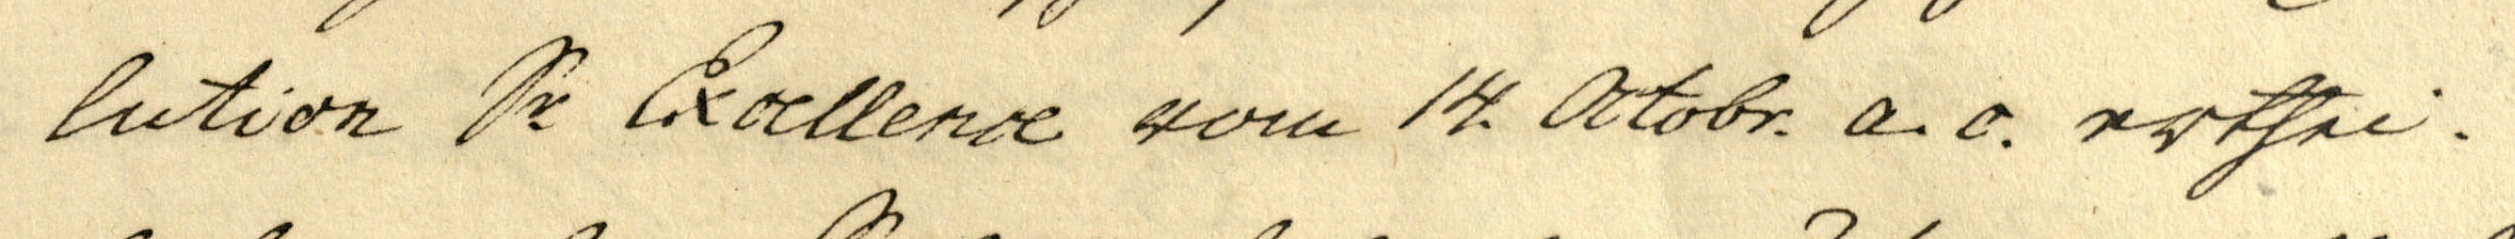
lution Sr Excellence vom 14. Octobr. a. c. erthei¬
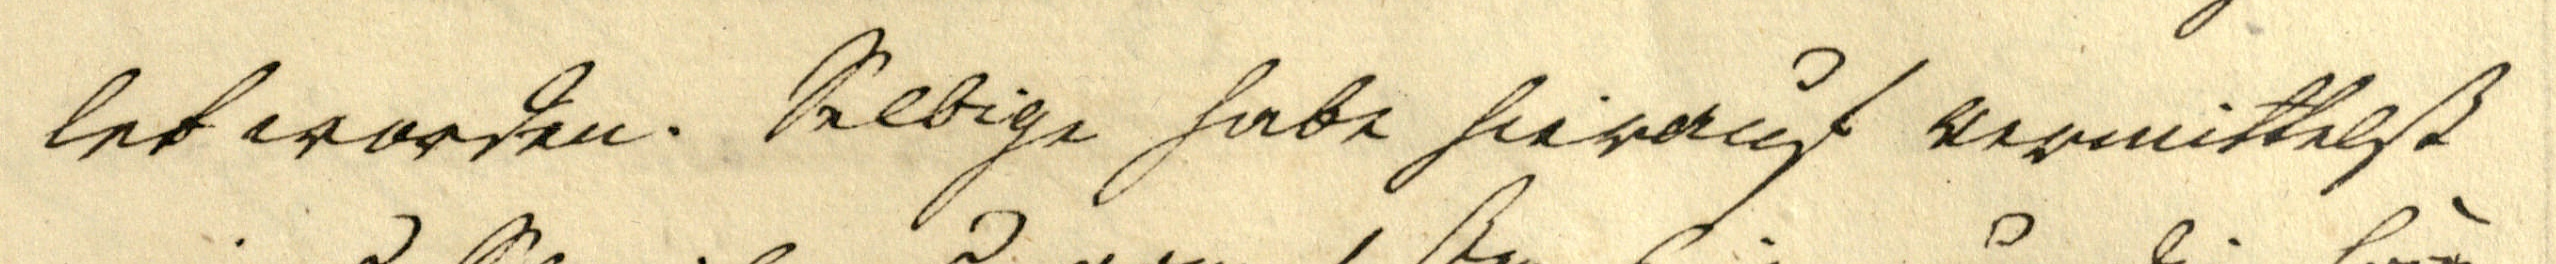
let worden. Selbige habe hierauf vermittelst
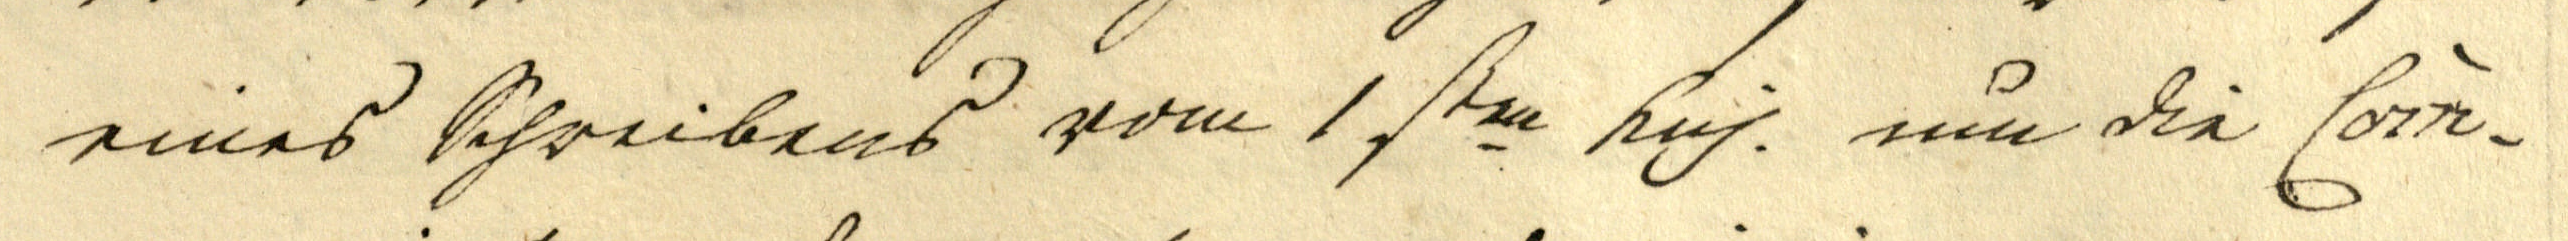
eines Schreibens vom 1 sten huj. um die Com¬
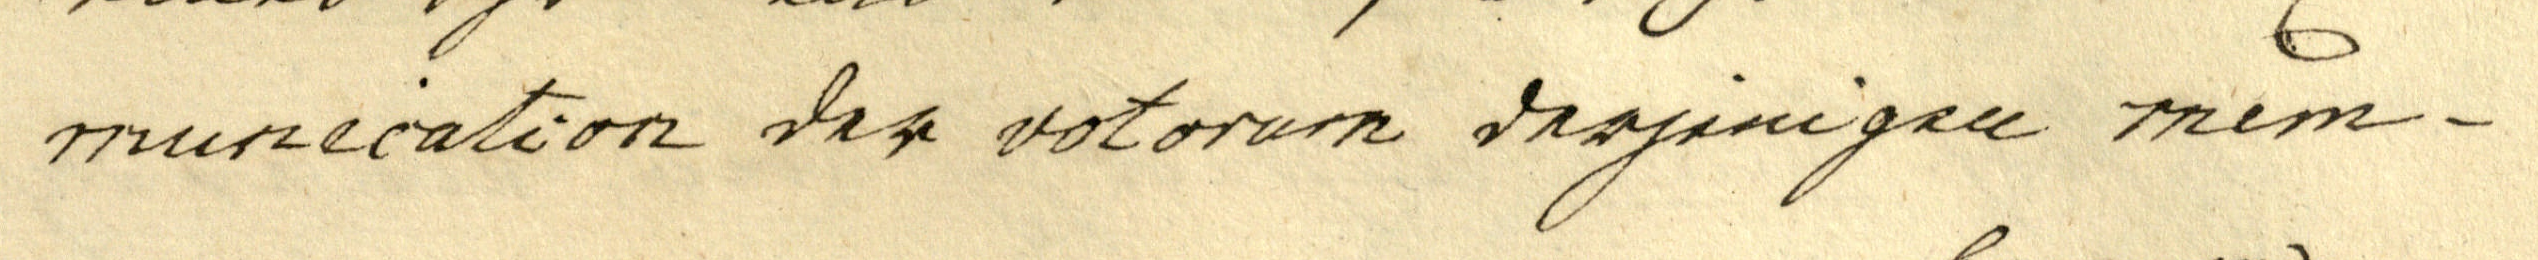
munication der votorum derjenigen mem¬
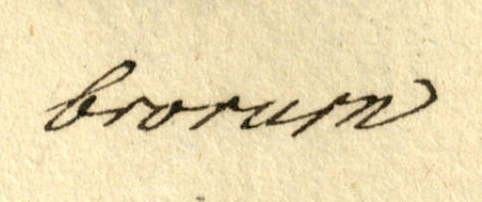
brorum
